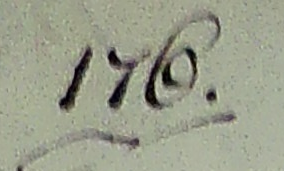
176.
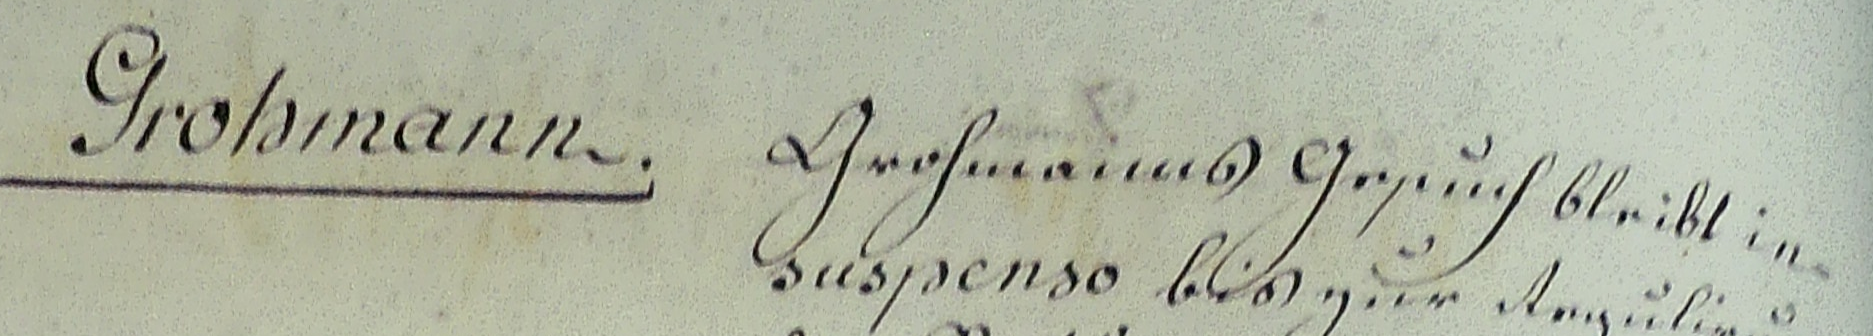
Grohmann. Grohmanns Gesuch bleibt in
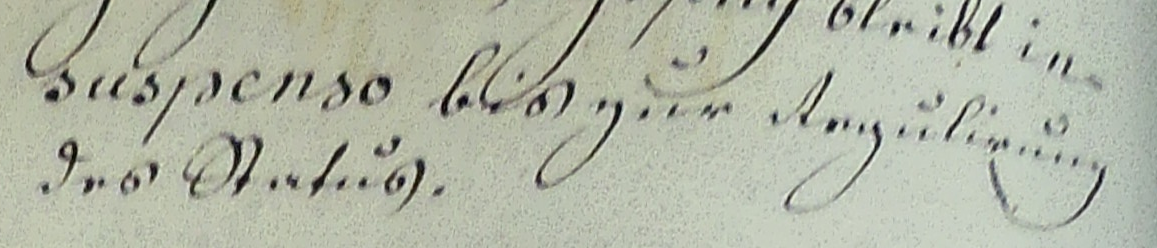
suspenso bis zur Regulirung
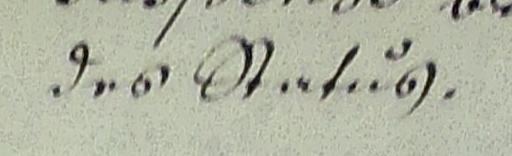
des Status.
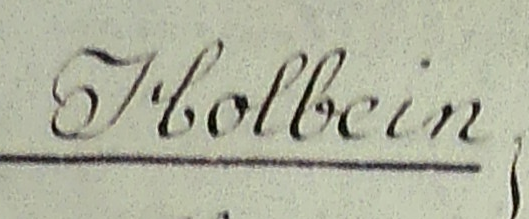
Holbein
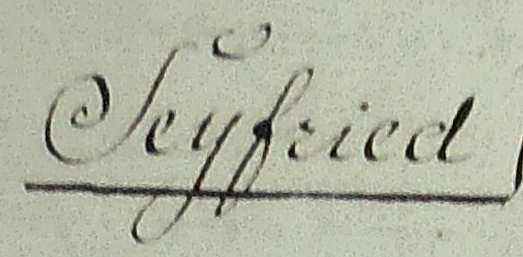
Seyfried
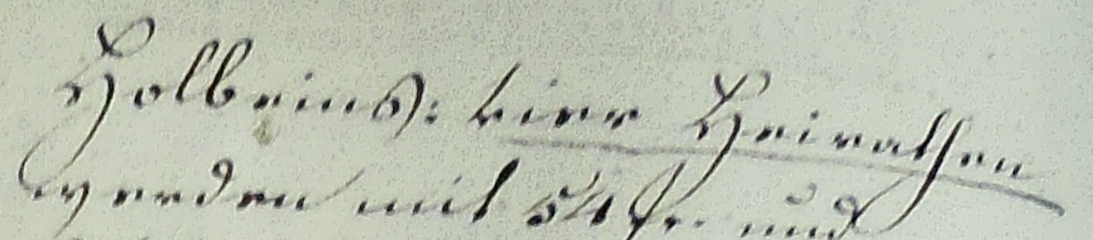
Holbeins: vier Heirathen
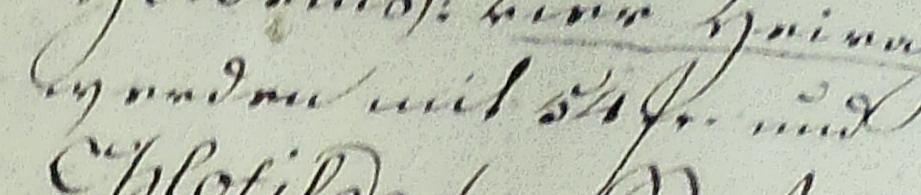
werden mit 54fr. und
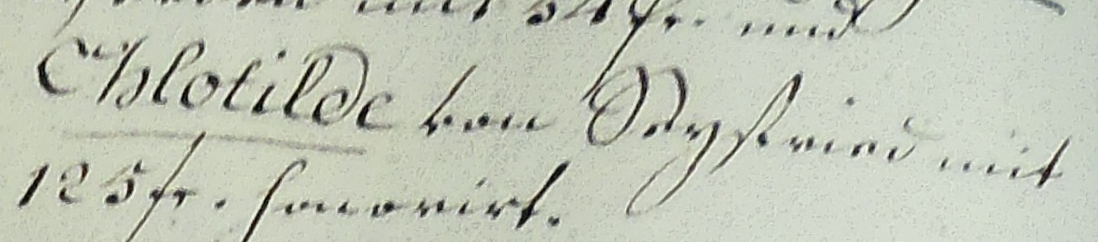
Klotilde von Seyfried mit
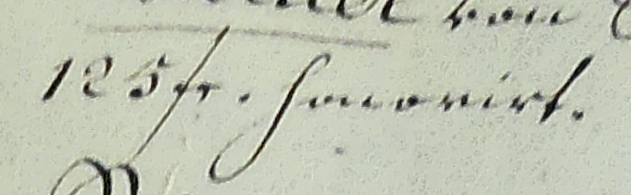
125fr. honorirt.
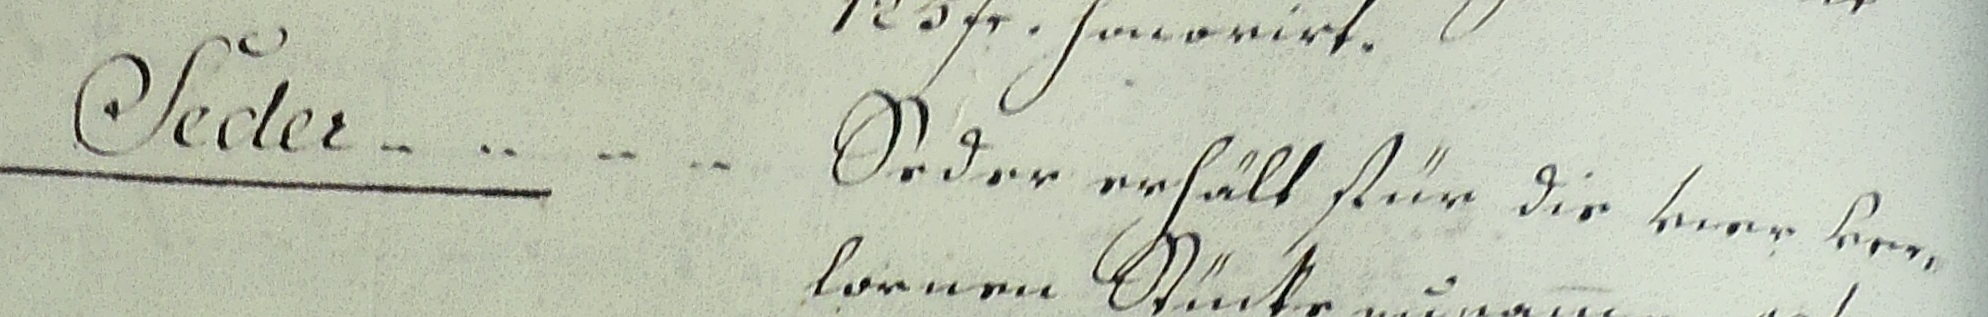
Seder .. .. .. .. Seder erhält für die vier ver¬
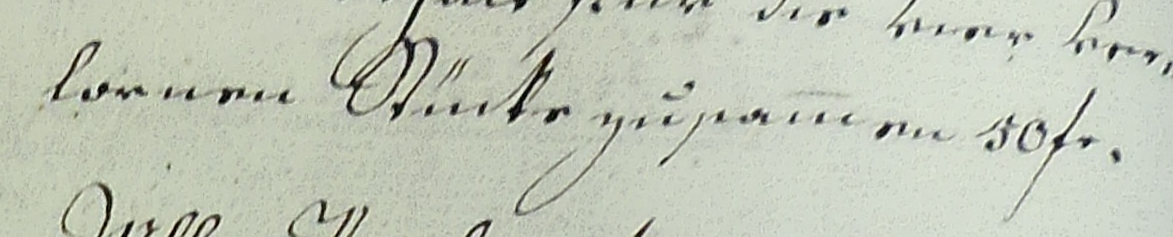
lornen Stücke zusamen 50fr.
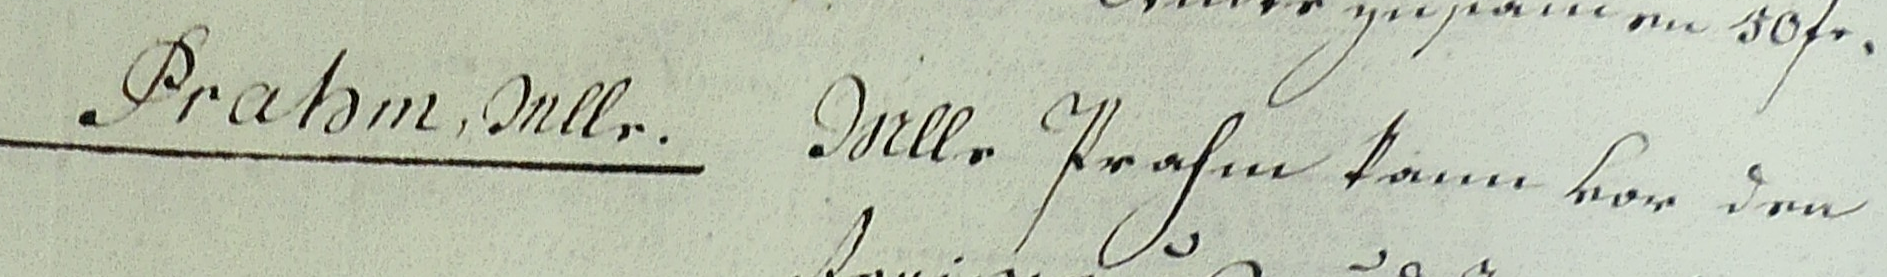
Prahm, Mlle. Mlle Prahm kann vor den
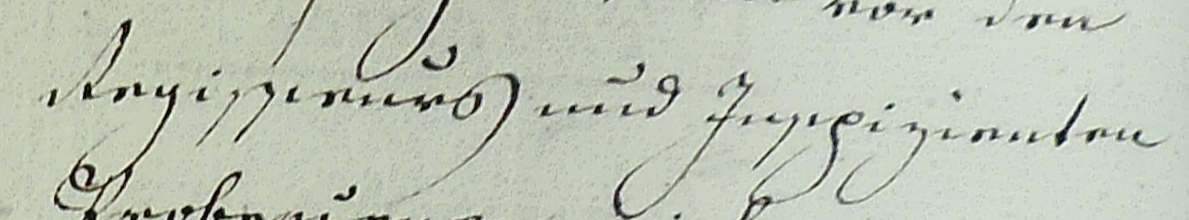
Regisseurs und Inspizienten
